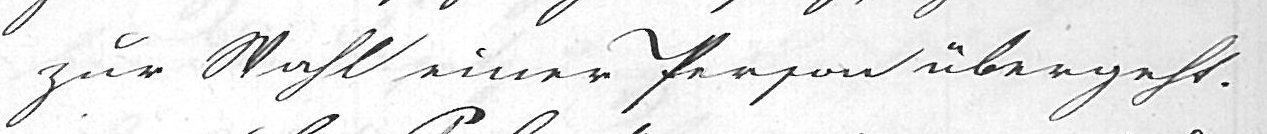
zur Wahl einer Person übergeht.
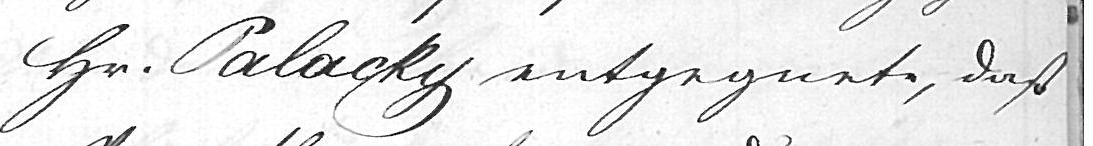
Hr. Palacky entgegnete, daß
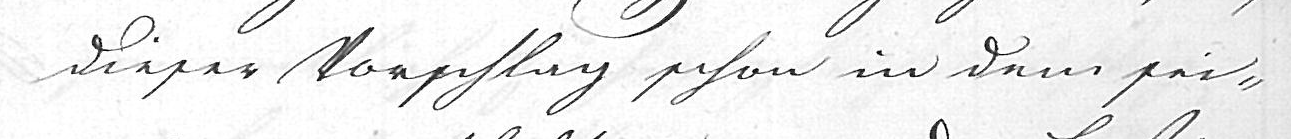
dieser Vorschlag schon in dem sei-
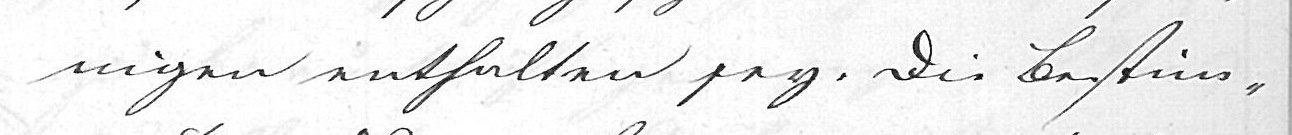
nigen enthalten sey. Die Bestim-
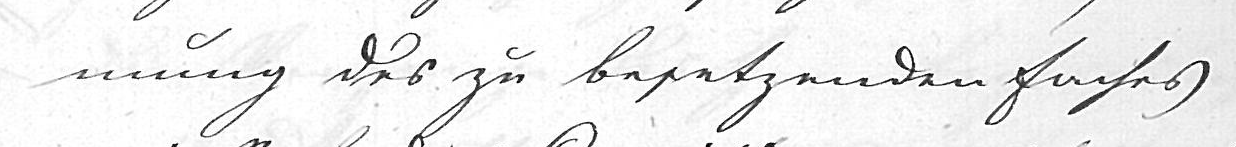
mung des zu besetzenden Faches
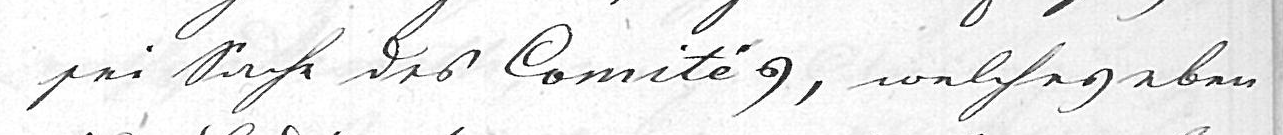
sei Sache des Comité's, welches eben
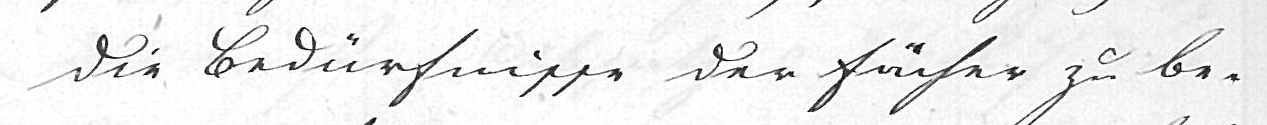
die Bedürfnisse der Fächer zu be-
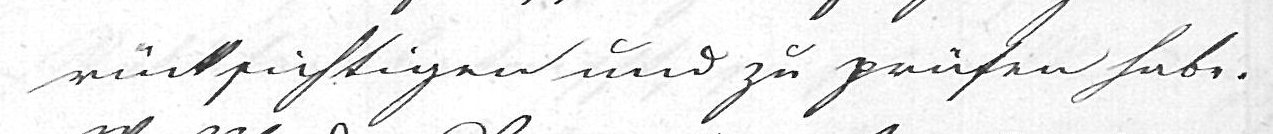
rücksichtigen und zu prüfen habe.
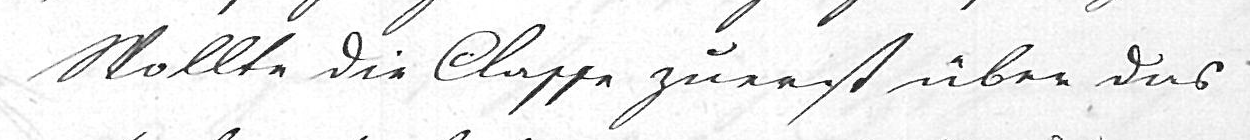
Wollte die Classe zuerst über das
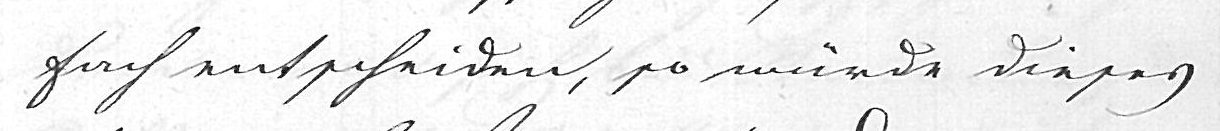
Fach entscheiden, so würde dieses
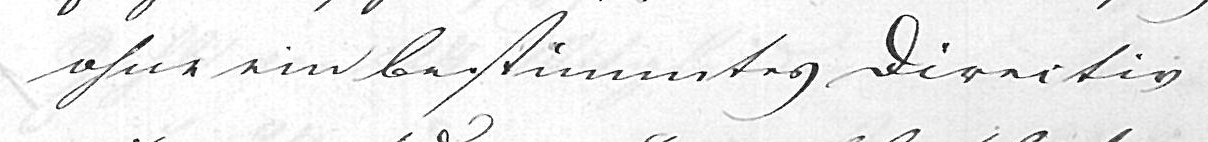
ohne ein bestimmtes Directiv
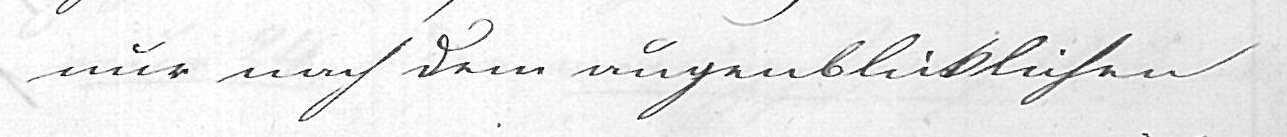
nur nach dem augenblicklichen
